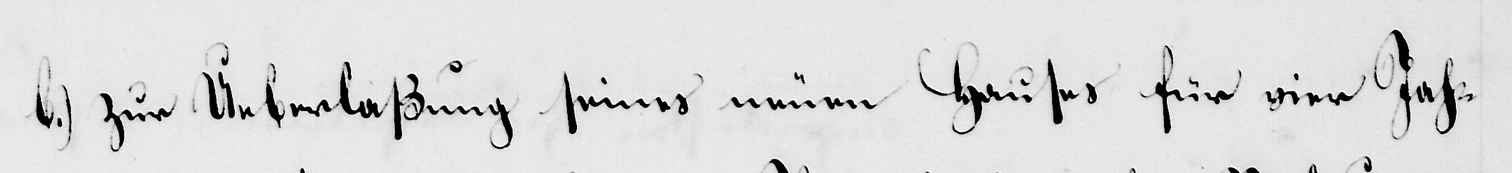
b.) zur Ueberlaßung seines neuen Hauses für vier Jah¬
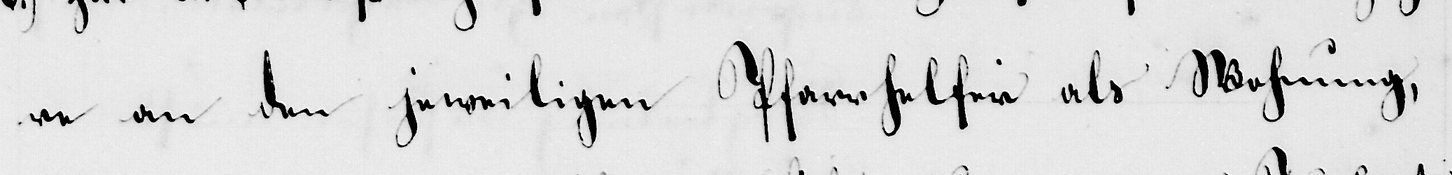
re an den jeweiligen Pfarrhelfer als Wohnung,
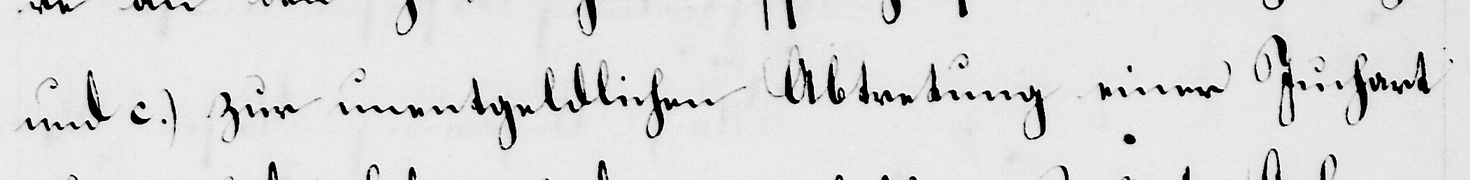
und c.) zur unentgeldlichen Abtretung einer Juchart
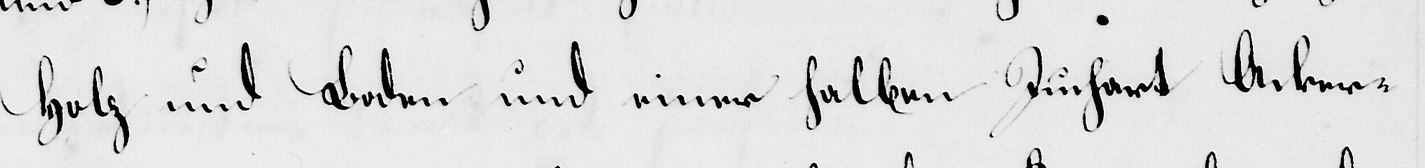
Holz und Boden und einer halben Juchart Acker¬
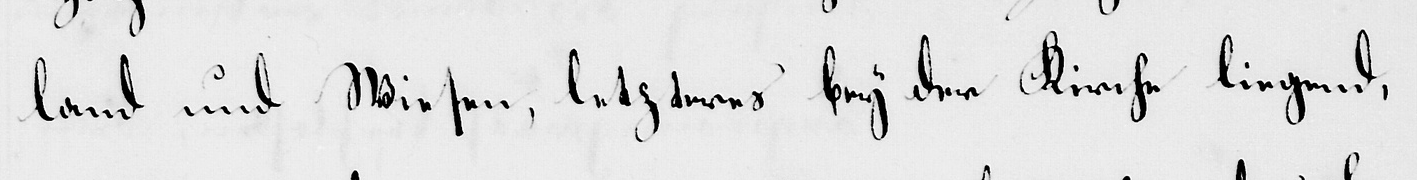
land und Wiesen, letzteres bey der Kirche liegend,
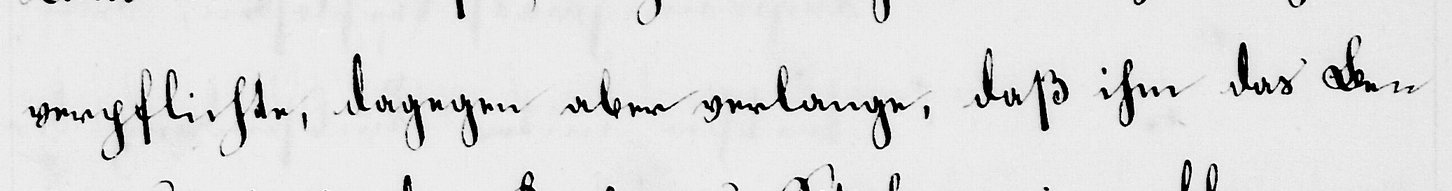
verpflichte, dagegen aber verlange, daß ihm das Ben¬
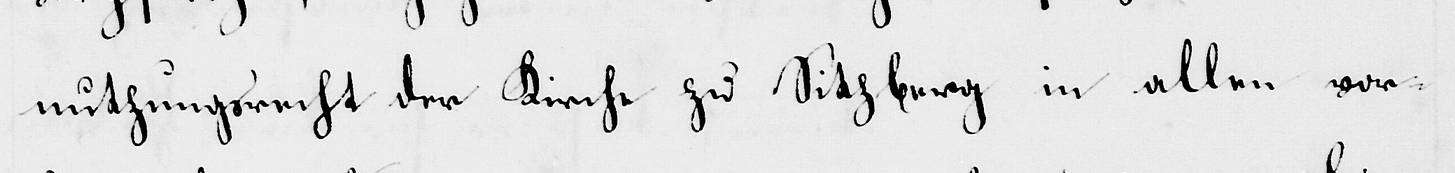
utzungsrecht der Kirche zu Sitzberg in allen vor¬
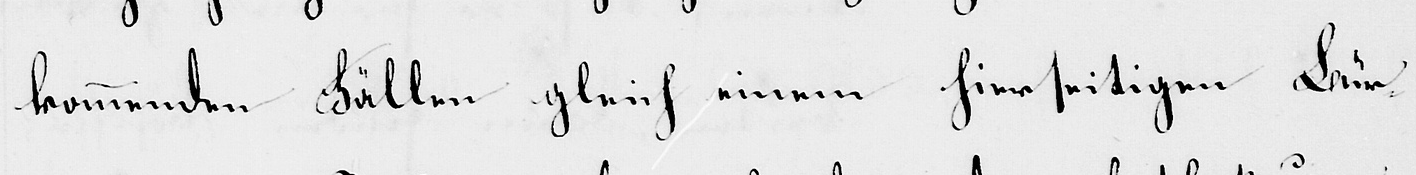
kommenden Fällen gleich einem hierseitigen Bür¬
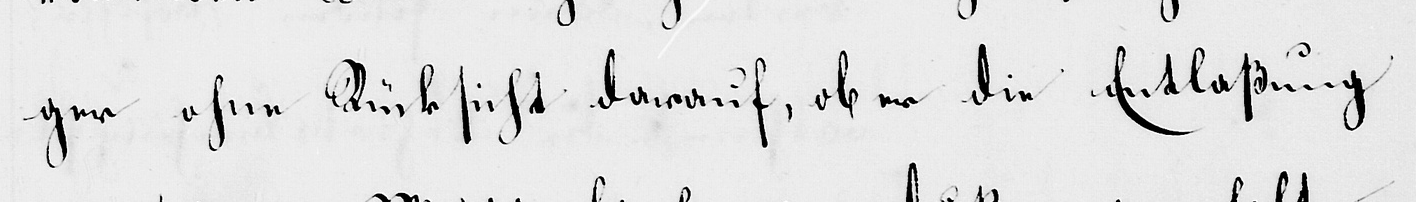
ger ohne Rücksicht darauf, ob er die Entlaßung
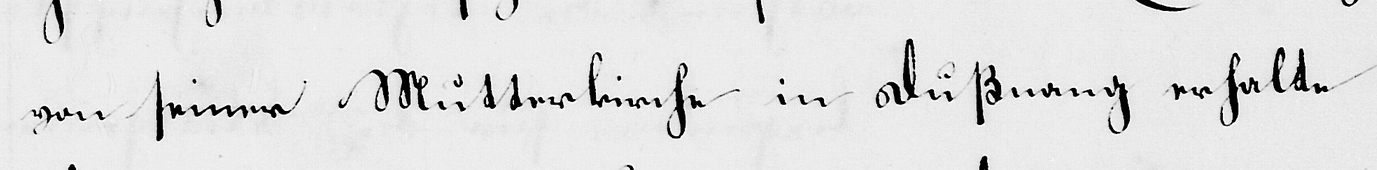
von seiner Mutterkirche in Dußnang erhalte
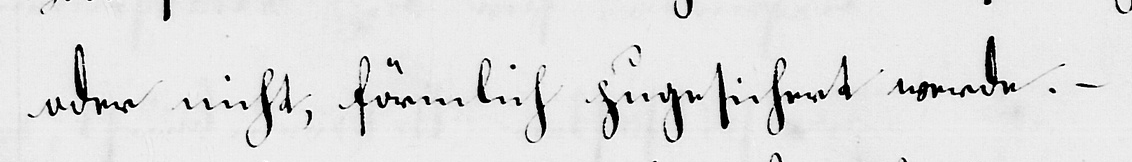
oder nicht, förmlich zugesichert werde.
